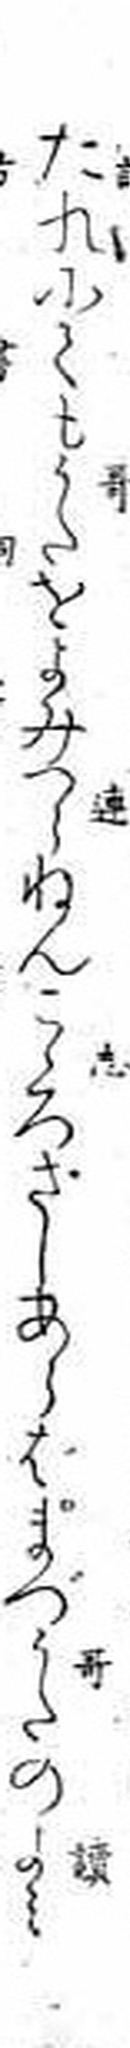たれにてもうたをよみつらねんこゝろざしあらば。まづうたのよみ
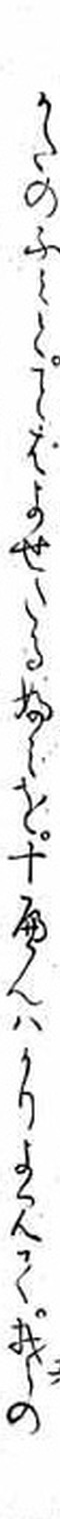かたのふみと。ことばよせたるふみを。十へんはかりよみて。その

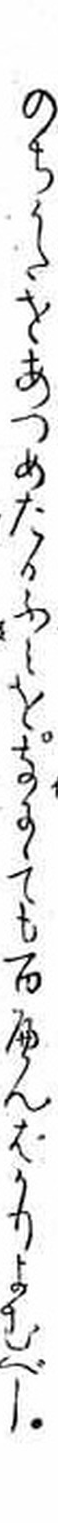のちうたをあつめたるふみを。なにゝても百へんばかりよむべし。
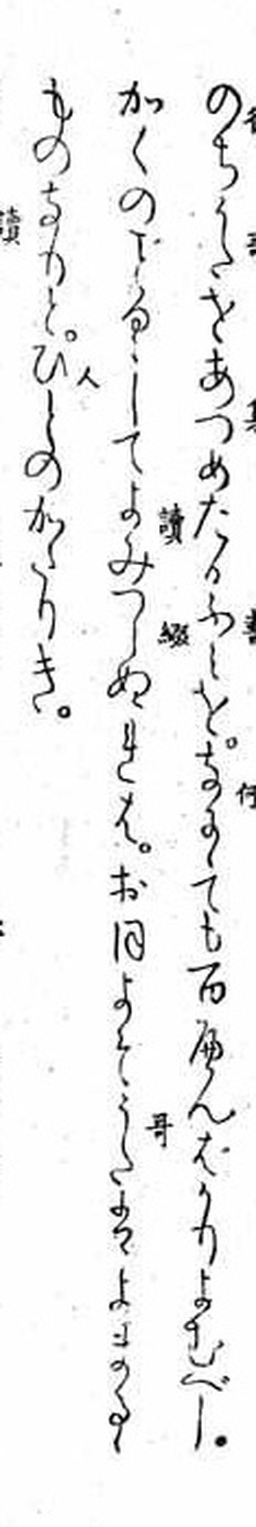かくのごとくしてよみつらぬれは。おほよそうたはよまるゝ
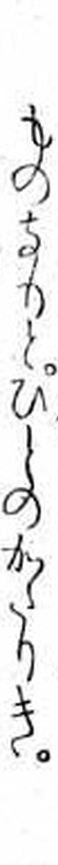ものなりと。ひとのかたりき。
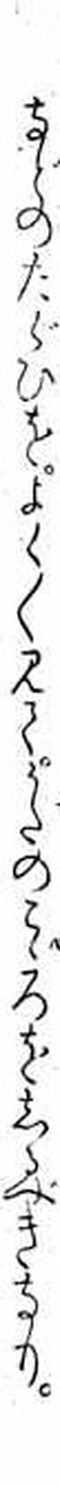などのたぐひを。よく〳〵見て。うたのこゝろをしるべきなり。
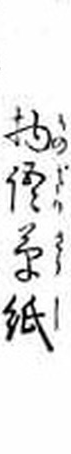物語草紙
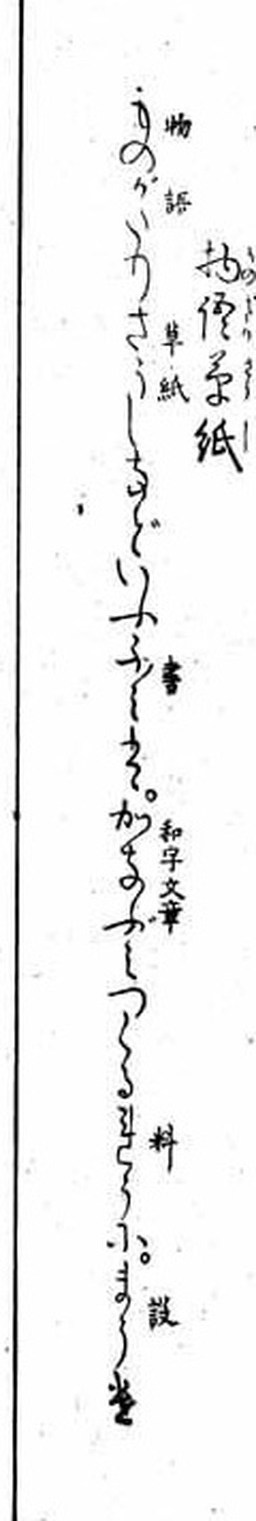ものがたりさうしなどいふふみは。かなぶみつくるれうに。まうけ
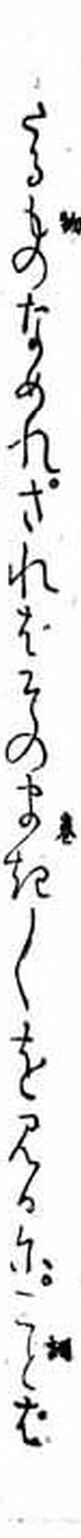たるものなめれ。さればそのまき〳〵を見るに。ことば
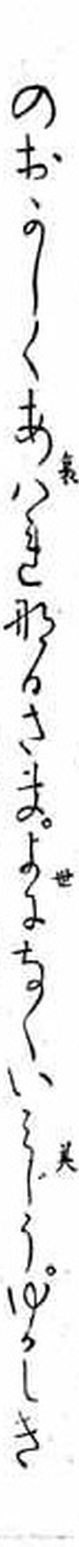のおかしくあはれなるさま。よになくいみじう。ゆかしき
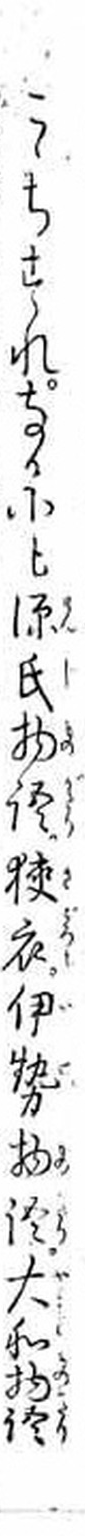こゝちすれ。なかにも源氏物語。狭衣。伊勢物語。大和物語
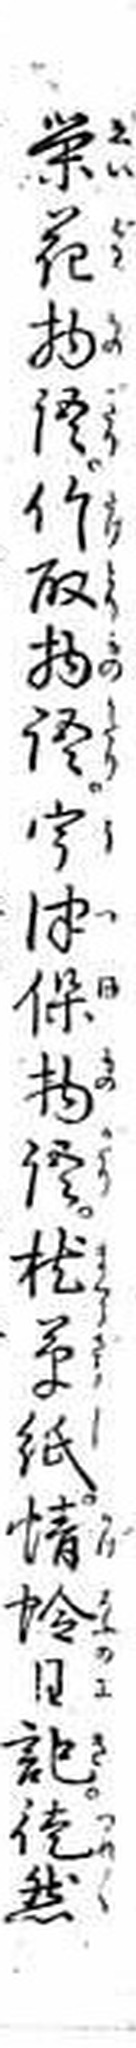栄花物語。竹取物語。宇津保物語。枕草紙。蜻蛉日記。徒然
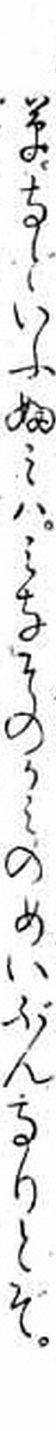草などいふふみは。みなそのかみのめいぶんなりとぞ。
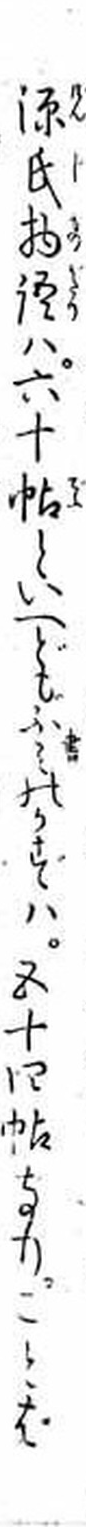源氏物語は。六十帖といへども。ふみのかずは。五十四帖なり。ことば
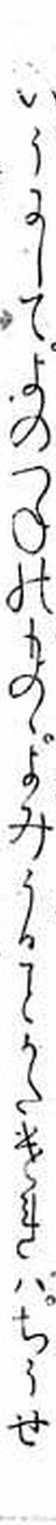いうにして。よのつねのものゝ。よみうることかたければ。ちうせ

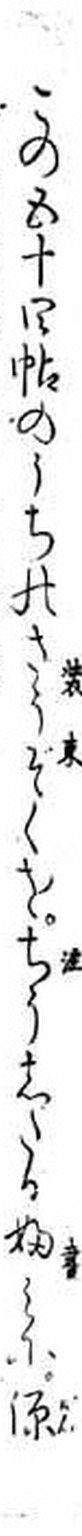この五十四帖のうちのさうぞくを。ちうしたるふみに。源
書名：女学範
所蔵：東京学芸大学教育コンテンツアーカイブ
